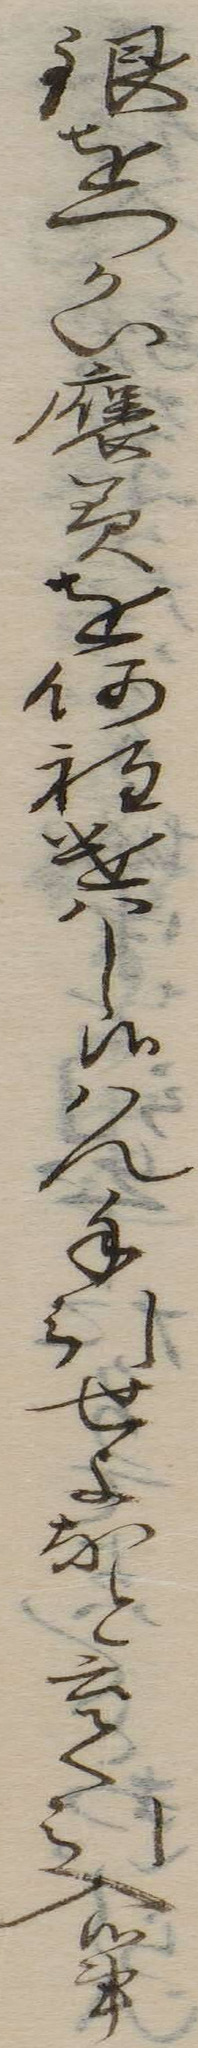銀をつかい褒美を何程遣はし候はん手引せよなと云て引入候事
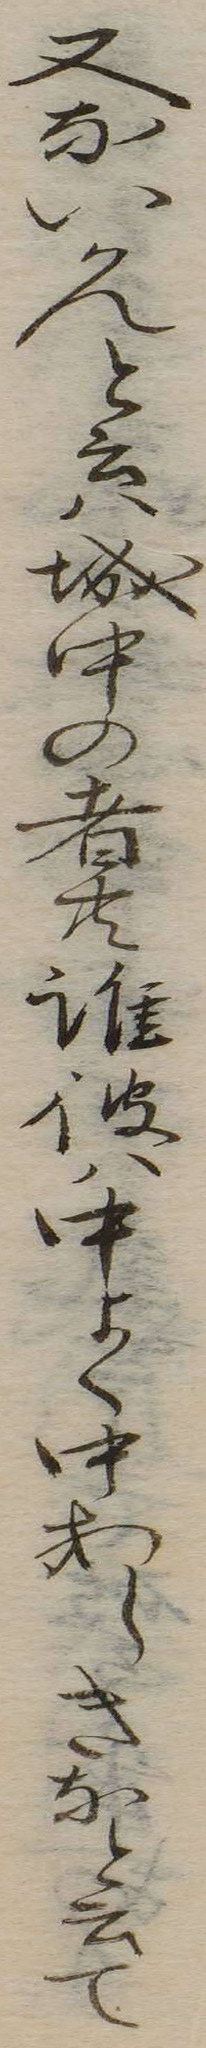又ないかんと云は城中の者共誰彼は中よく中あしきなと云て

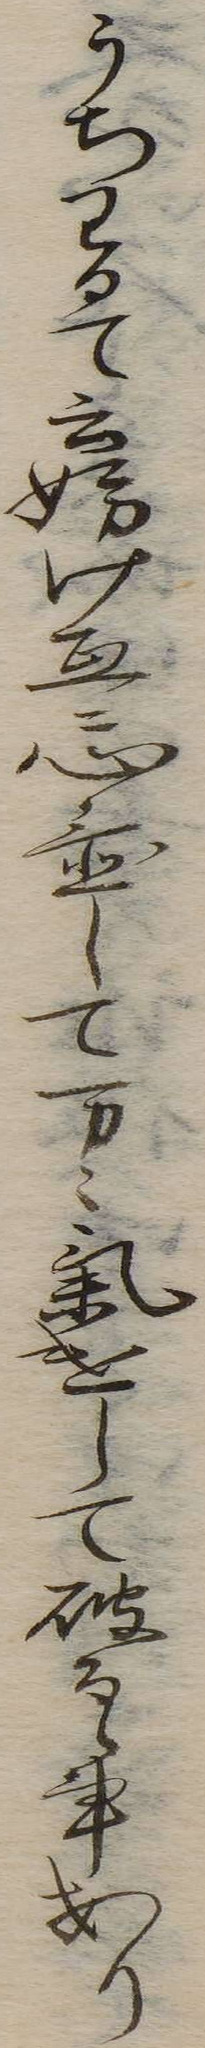うちわるて云始御互に心置して万々気遣して破るゝ事あり
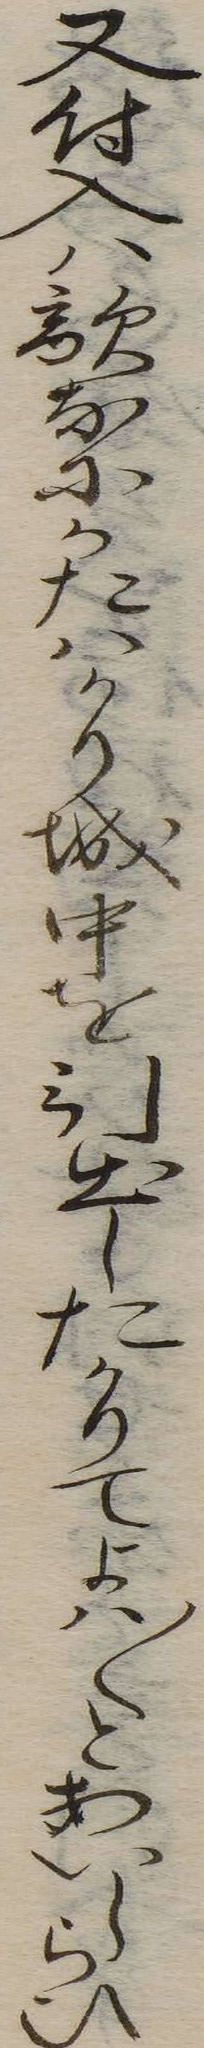又付入は敵なにかたはかり城中を引出したかりてよは〳〵とあいしらひ
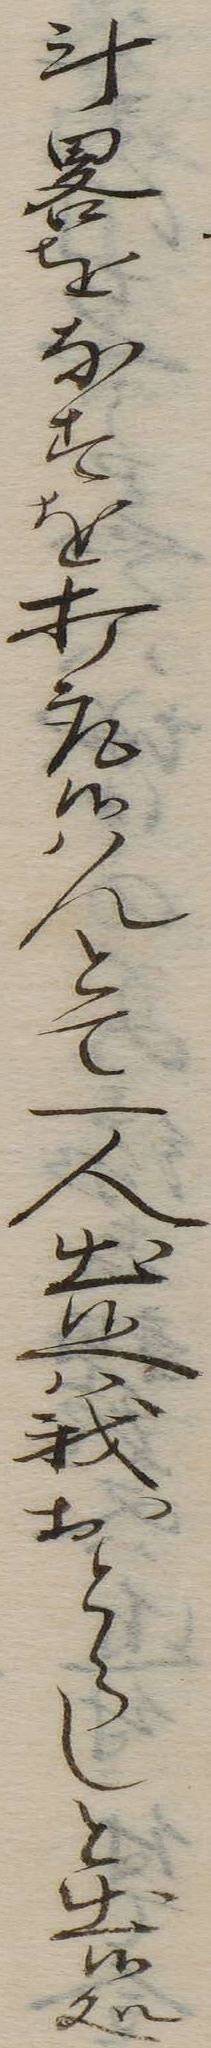計略をなすを打取候はんとて一人出候へは我おとらしと出候処
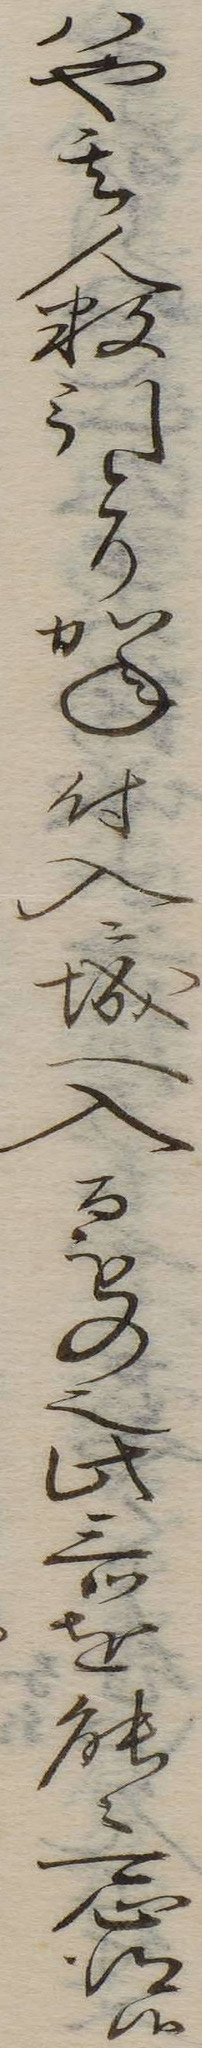はや其人数引とりかね付入に城へ入るもの也此三つを能々可心得候
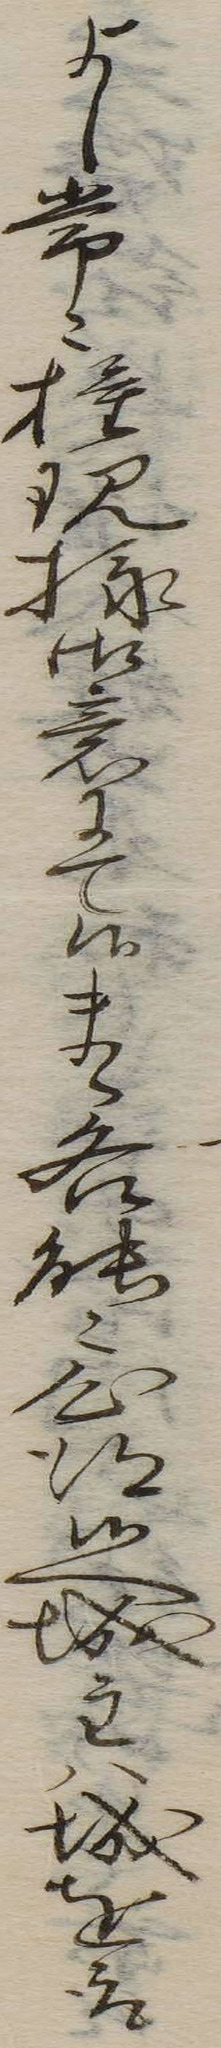よし常に権現様御意にて候まゝ各能々心得候へ城主は城を取
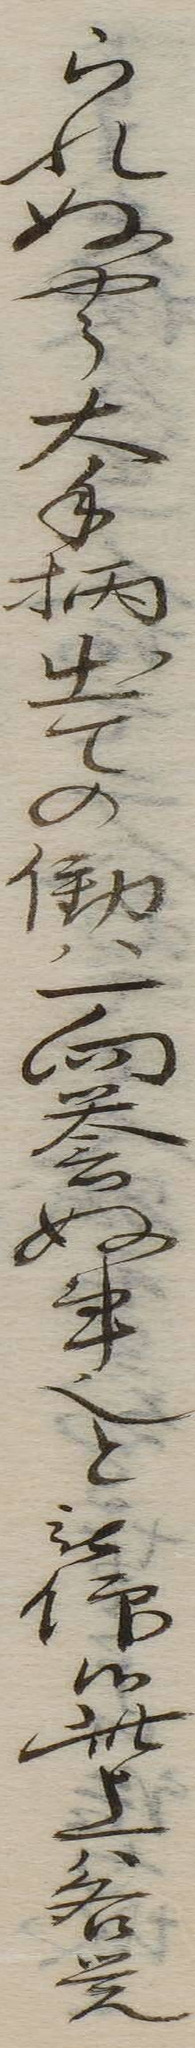られぬやう大手柄出ての働は一向誉ぬ事也と被仰候此上は各覚
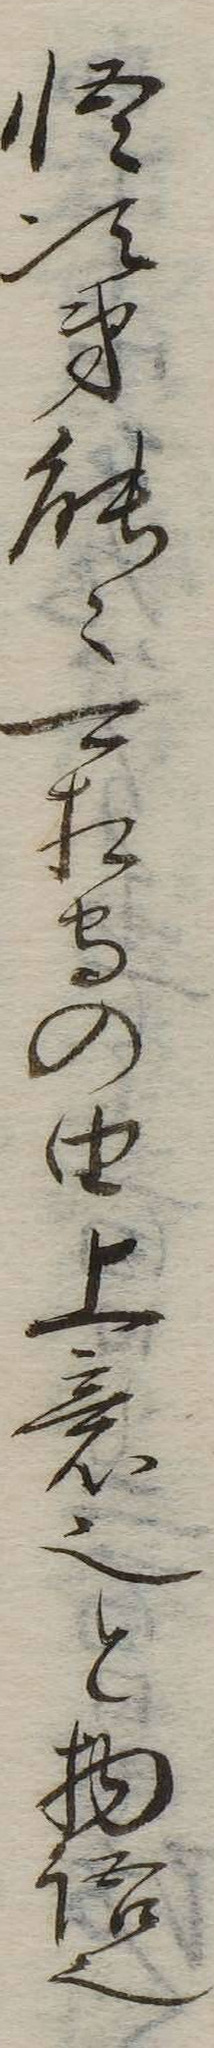悟次第能々可相守の由上意也と物語也
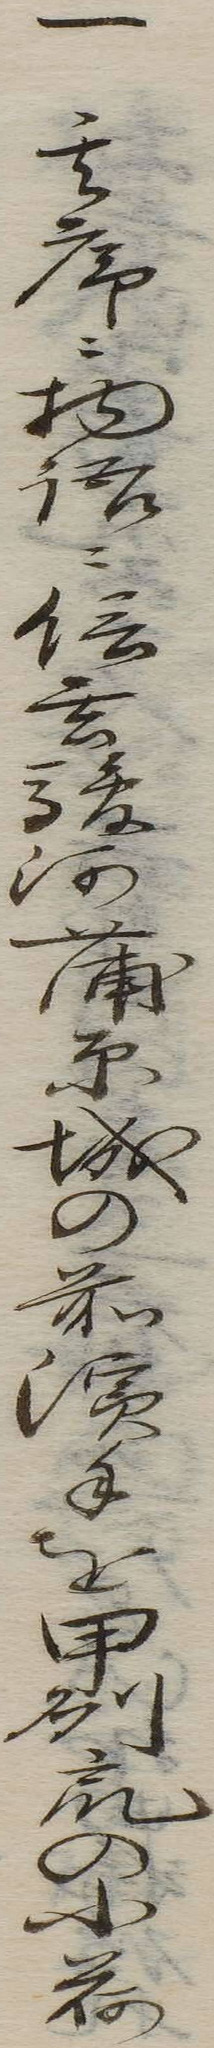一其序に物語に信玄駿河蒲原城の前浜手を甲州衆の小荷
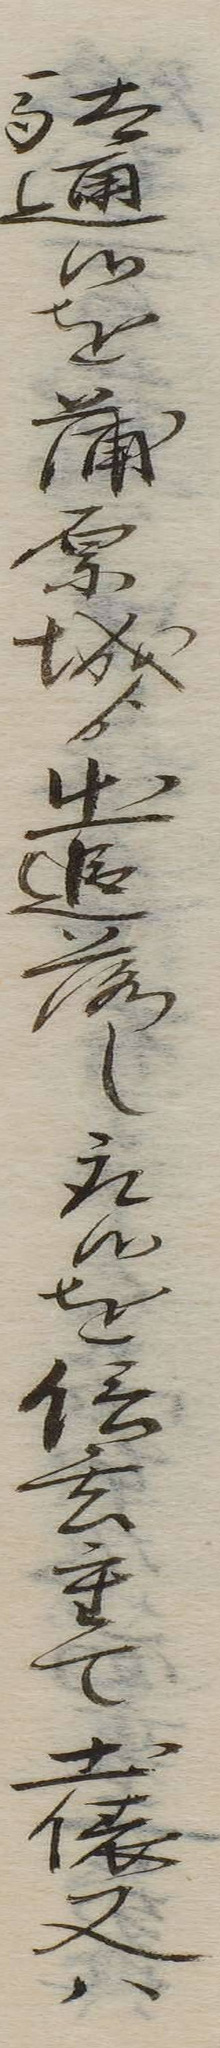駄通候を蒲原城より出追落し取候を信玄重て土俵又は
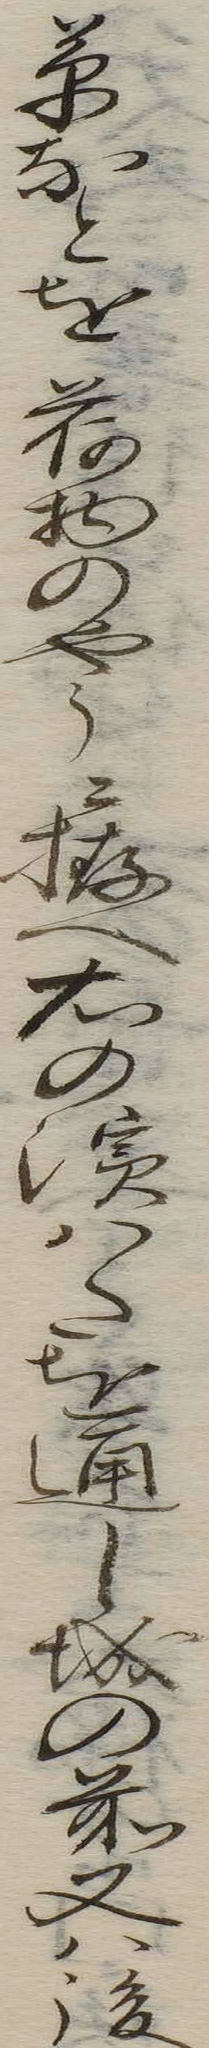草なとを荷物のやうに拵へ右の浜はたを通し城の前又は後
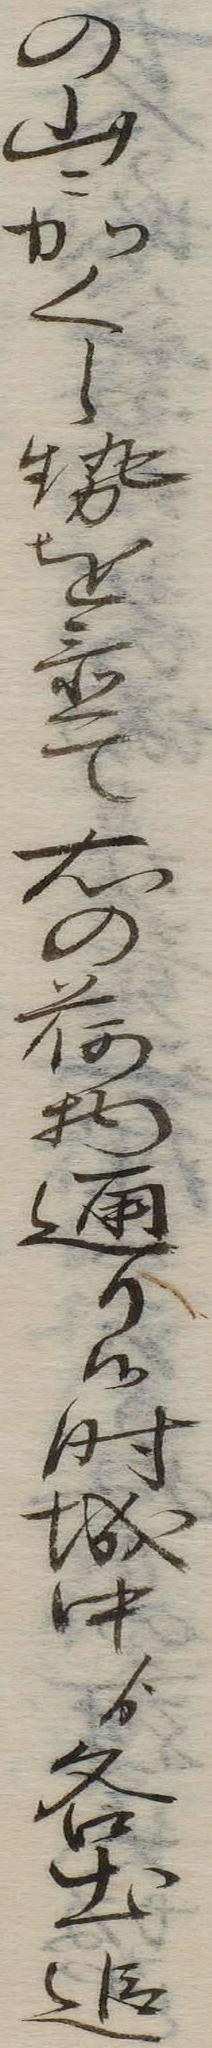の山にかくし勢を置て右の荷物通り候時城中より各出追
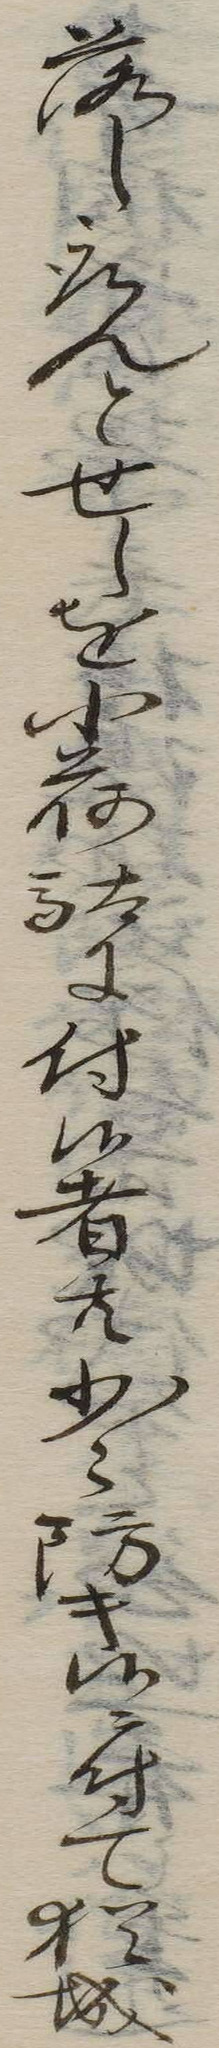落し取んとせしを小荷駄に付候者共少々防き候に付て猶城
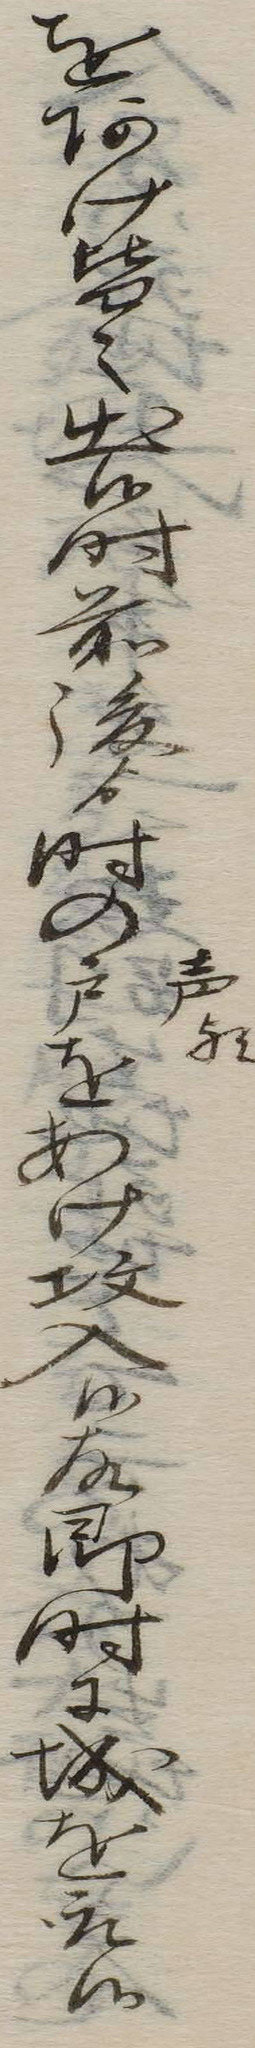をあけ皆々出候時前後より時の戸をあけ攻入候故即時に城を取候
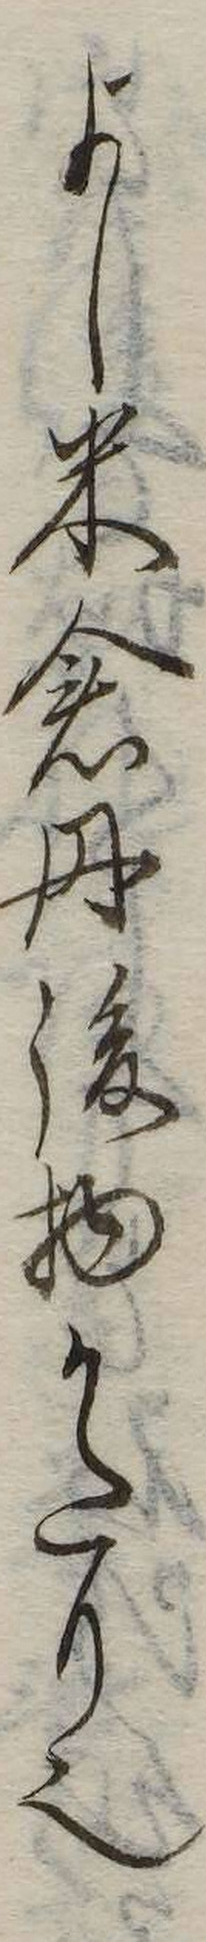よし米倉丹後物かたり也
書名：三河之物語
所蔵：国文学研究資料館
